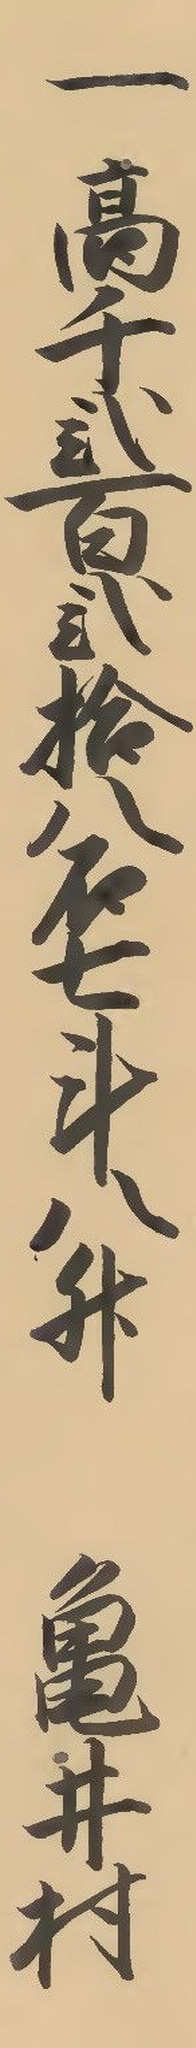一高千弐百弐拾八石七斗八升亀井村
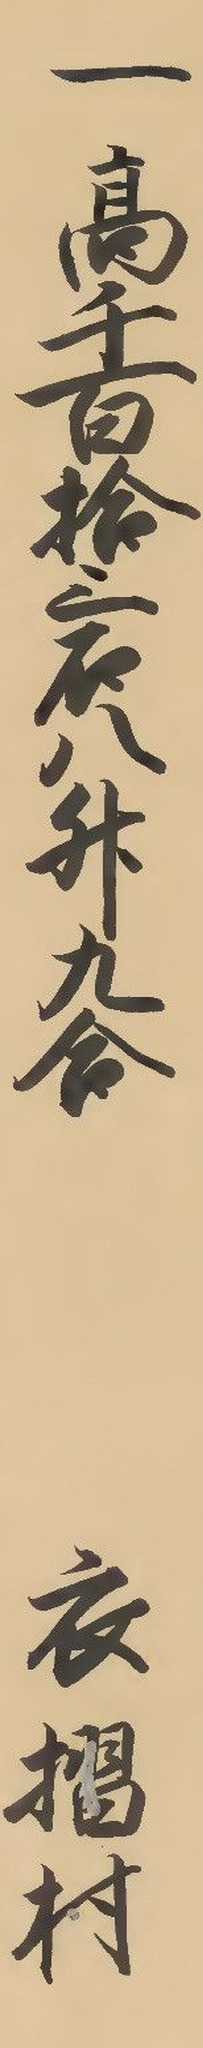一高千百拾三石八升九合衣摺村
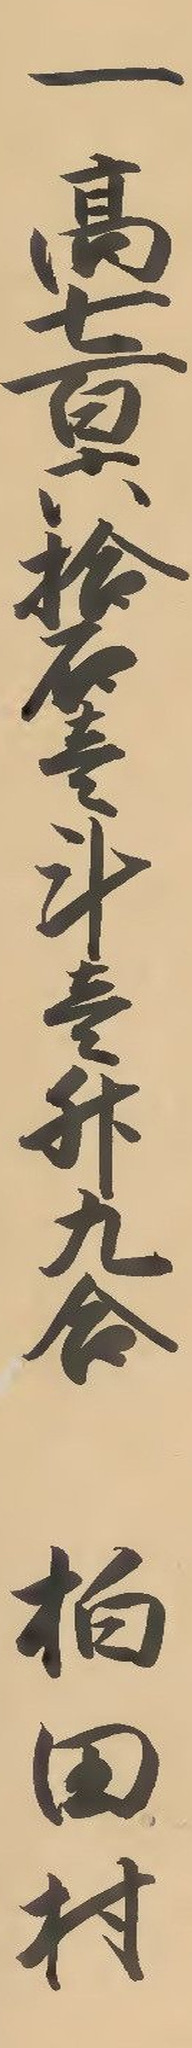一高七百六拾石壱斗壱升九合柏田村
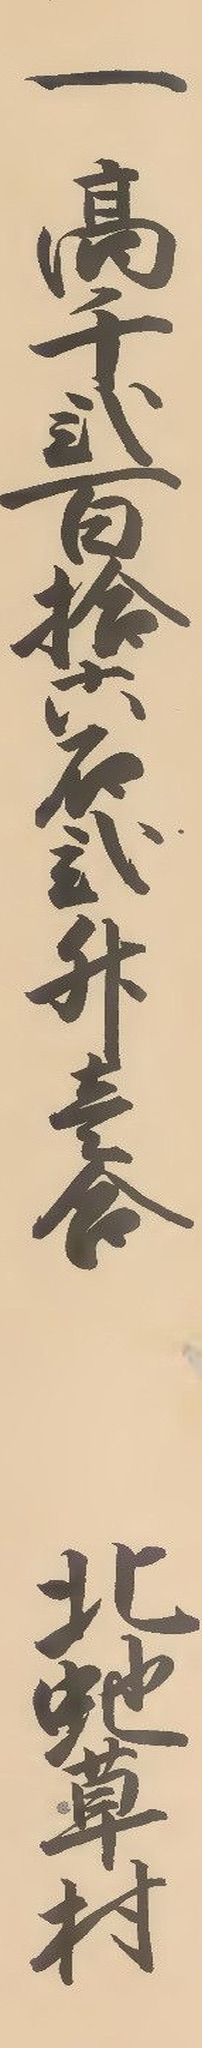一高千弐百拾六石弐升壱合北蛇草村
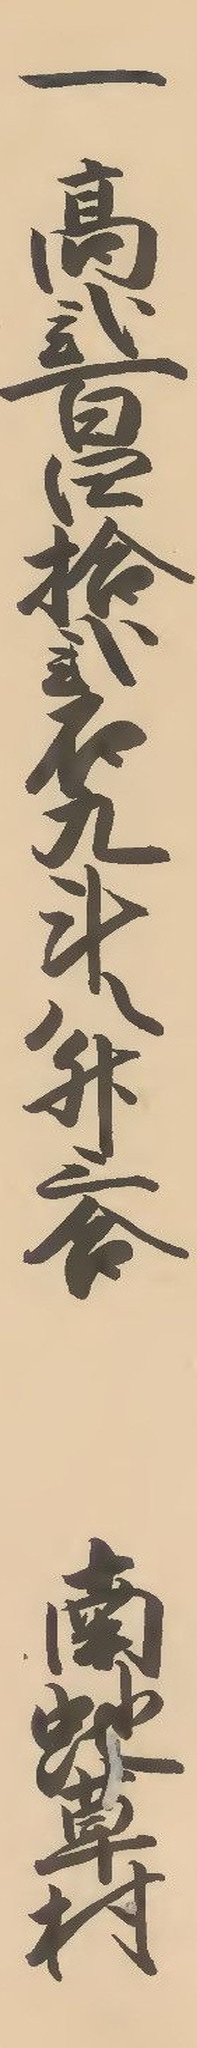一高弐百四拾弐石九斗八升三合南蛇草村
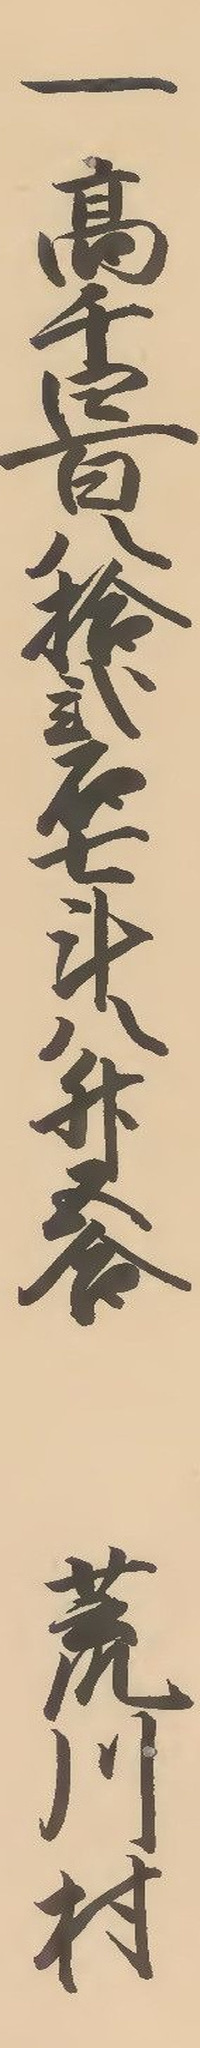一高千四百八拾弐石七斗八升五合荒川村
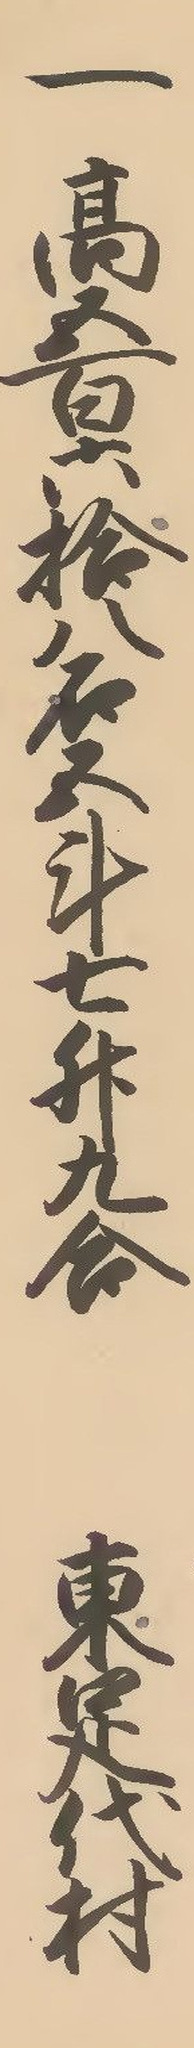一高五百六拾八石五斗七升九合東足代村

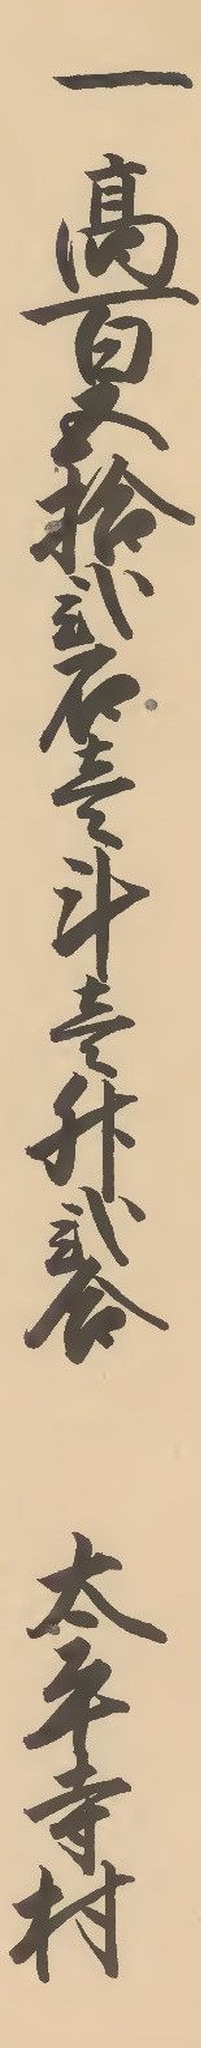一高百五拾弐石壱斗壱升弐合太平寺村
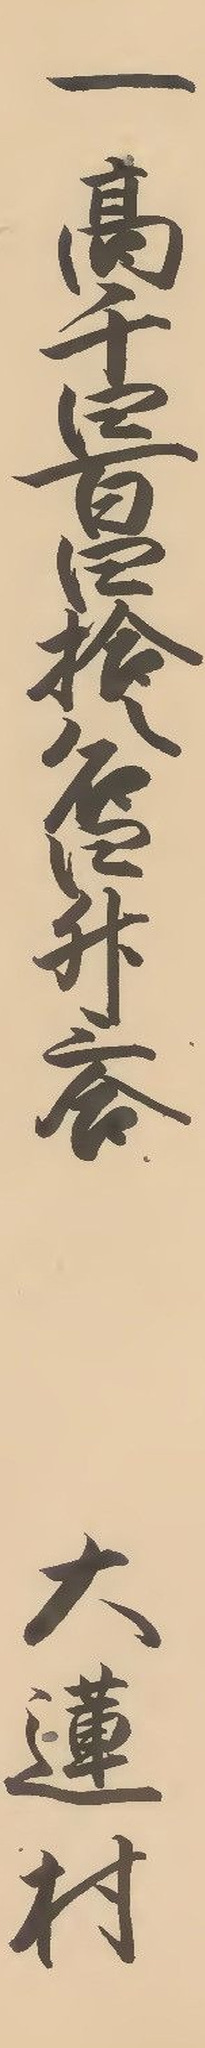一高千四百四拾八石四升三合大蓮村
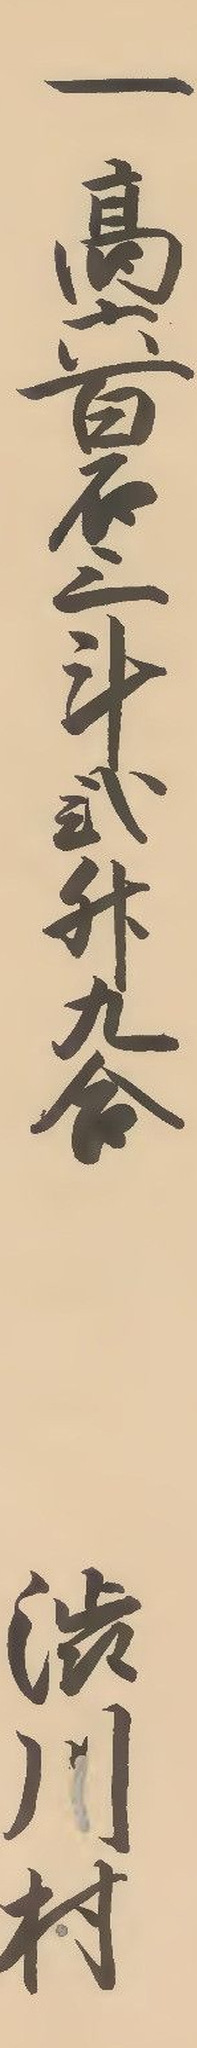一高六百石三斗弐升九合渋川村
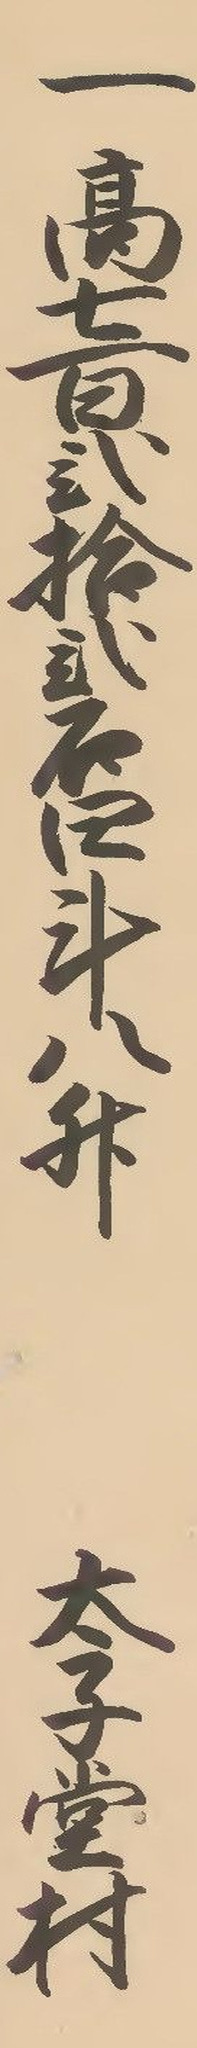一高七百弐拾弐石四斗八升太子堂村
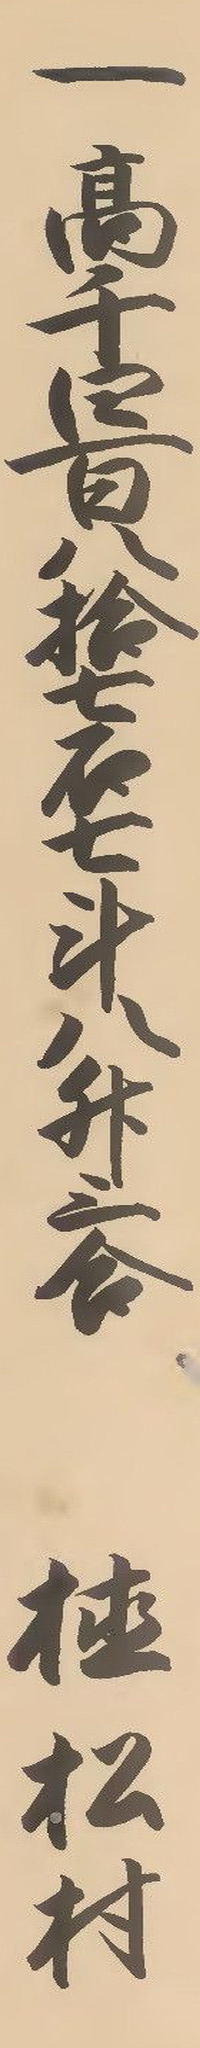一高千四百八拾七石七斗八升三合植松村
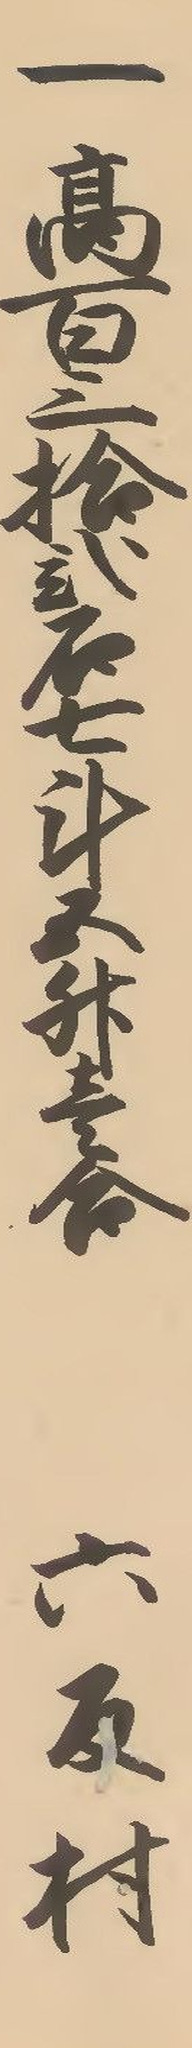一高百三拾弐石七斗五升壱合六反村
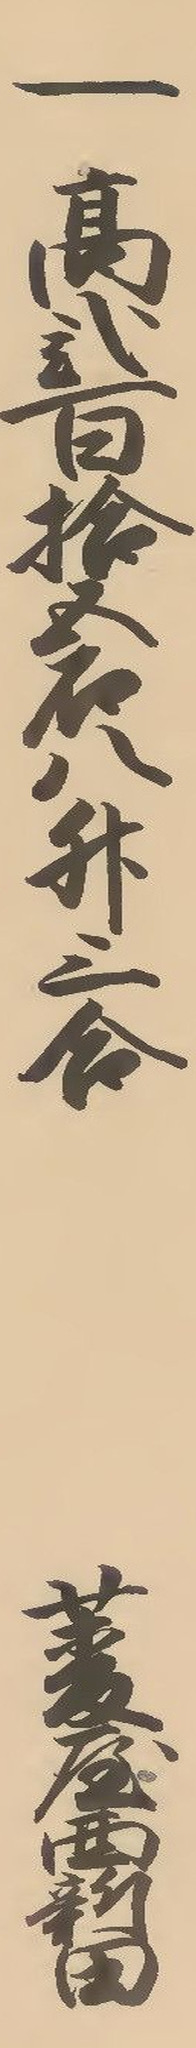一高弐百拾五石八升三合菱屋西新田
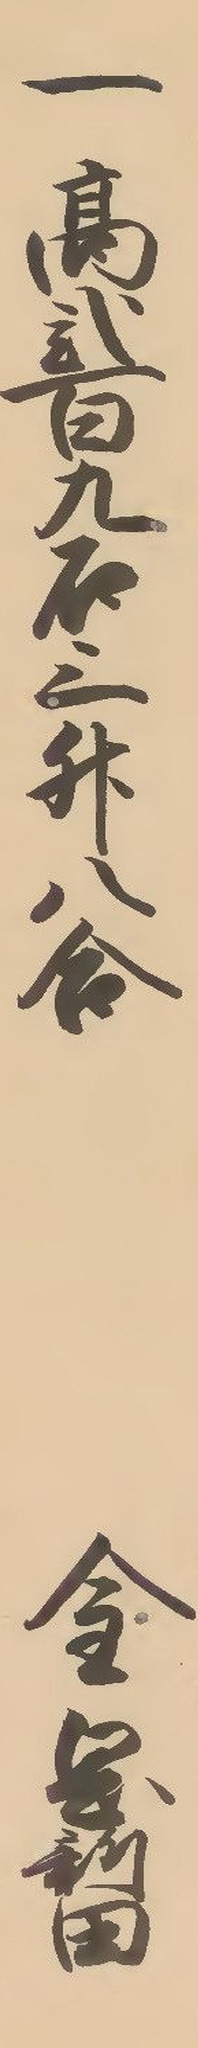一高弐百九石三升八合金岡新田

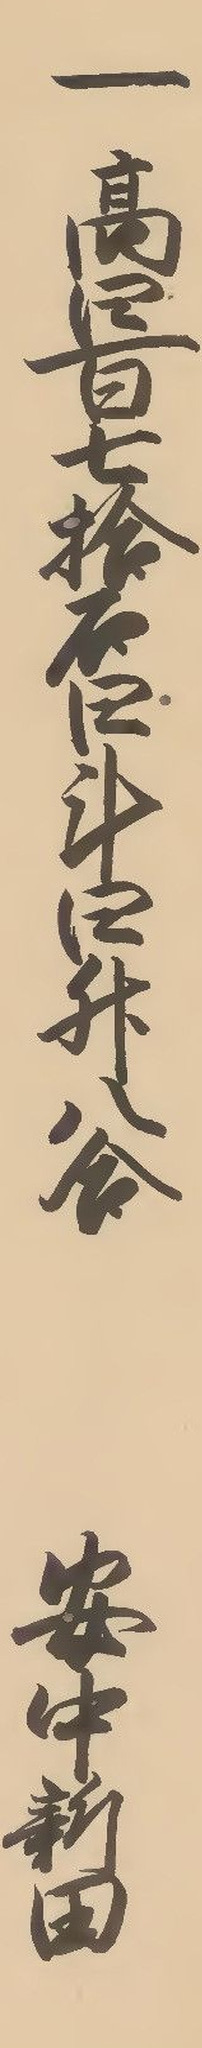一高四百七拾石四斗四升八合安中新田
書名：河内国郷帳
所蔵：国立公文書館 National Archives of Japan
